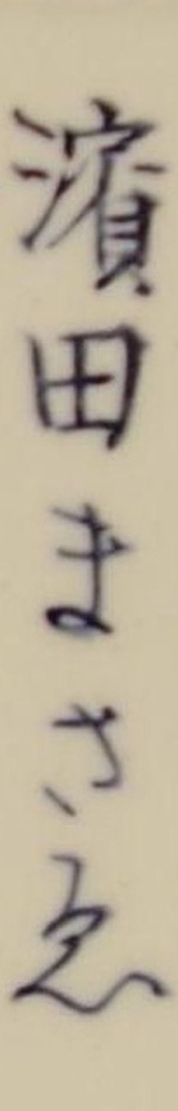濱田まさえ
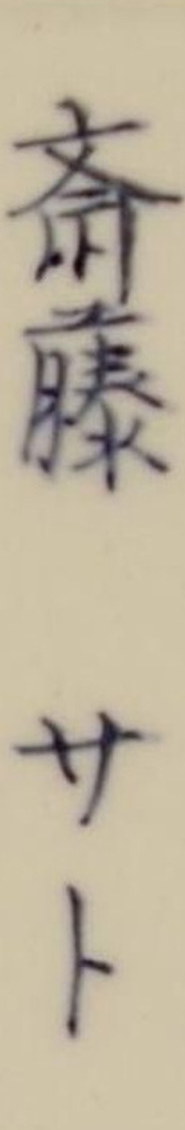斎藤サト
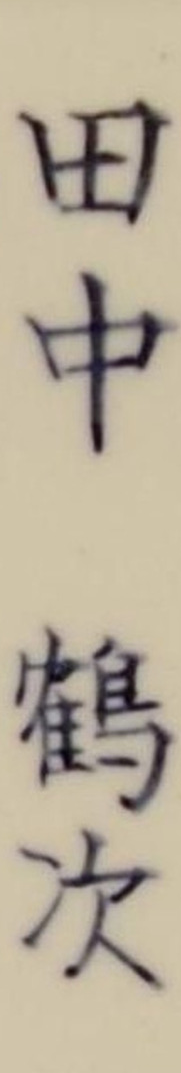田中鶴次
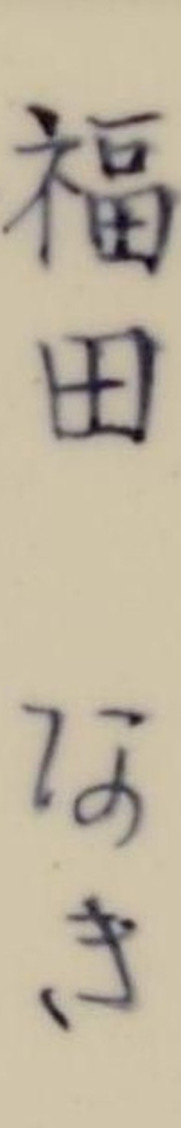福田なき
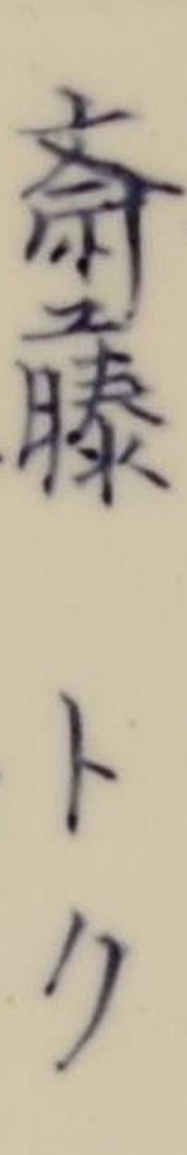斎藤トク
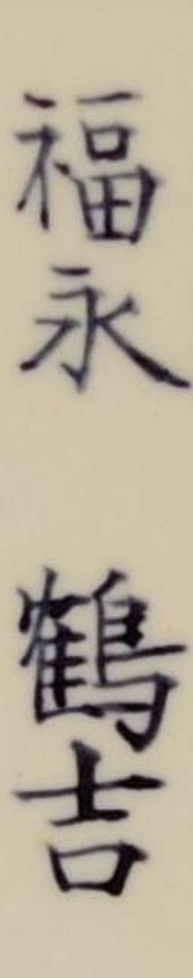福永鶴吉
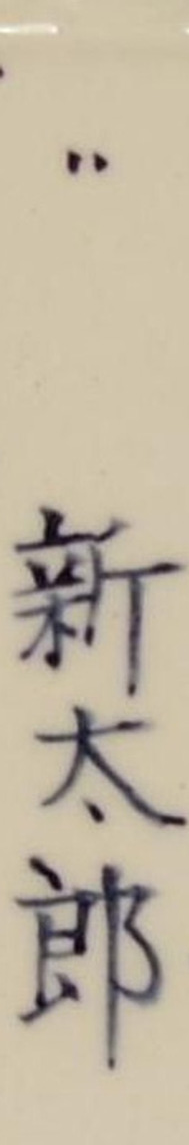新太郎
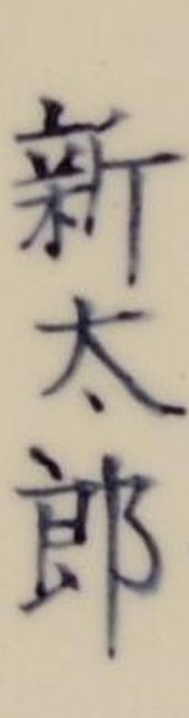新太郎
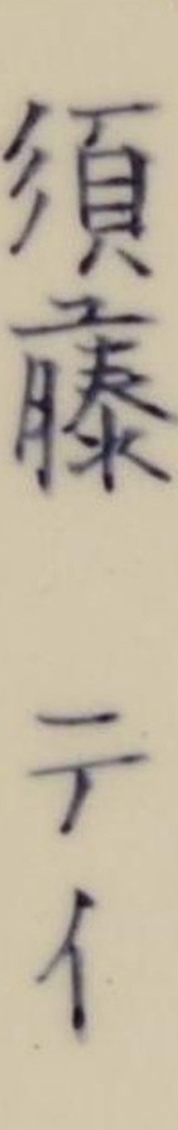須藤テイ
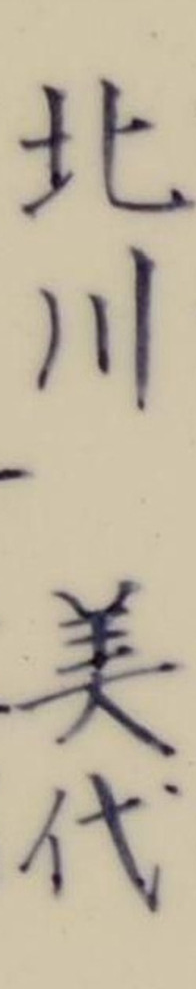北川美代
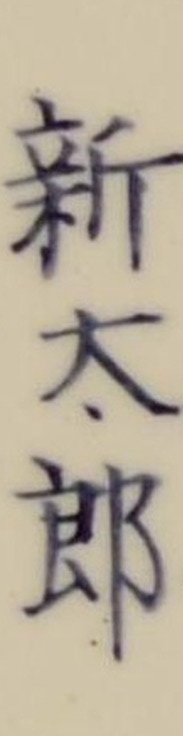新太郎
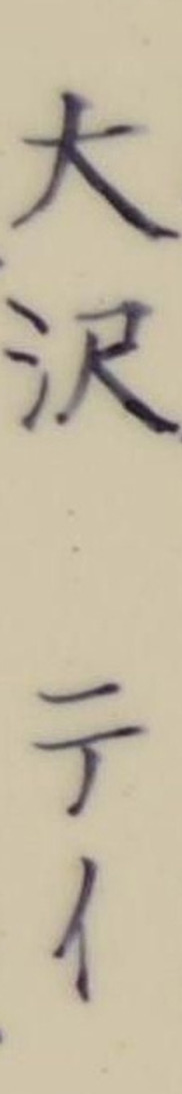大沢テイ

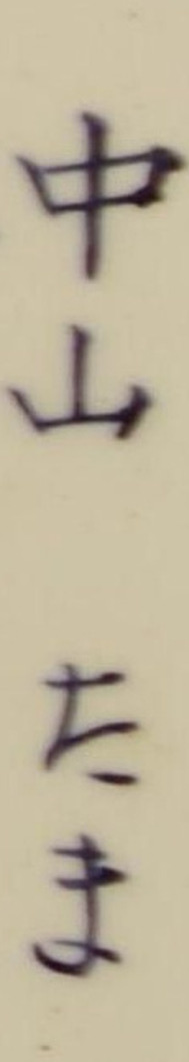中山たま
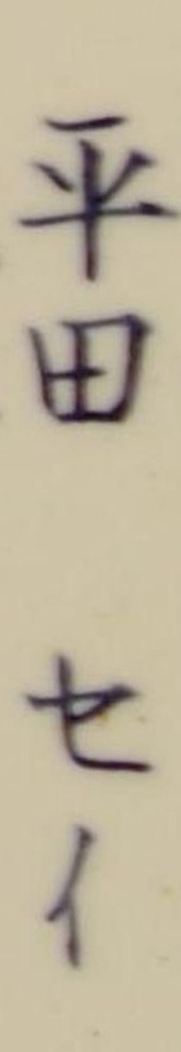平田セイ
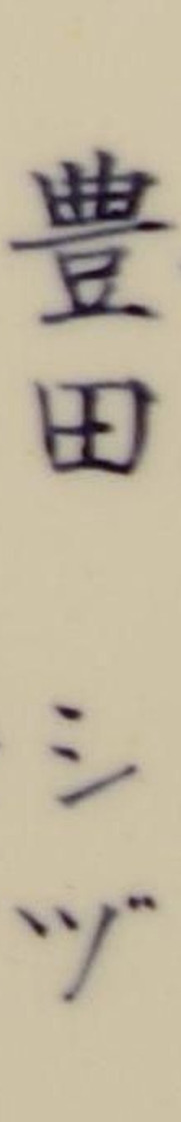豊田シヅ
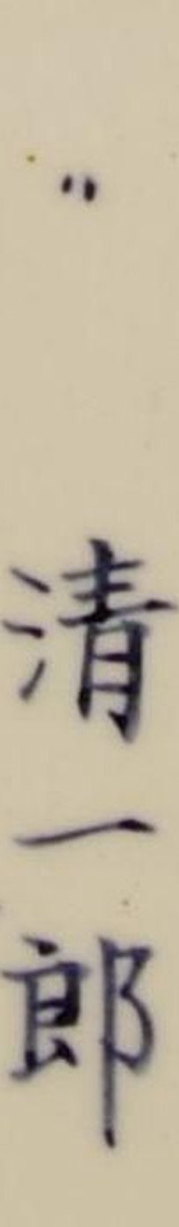清一郎
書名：E~L
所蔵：高野山金剛峯寺
